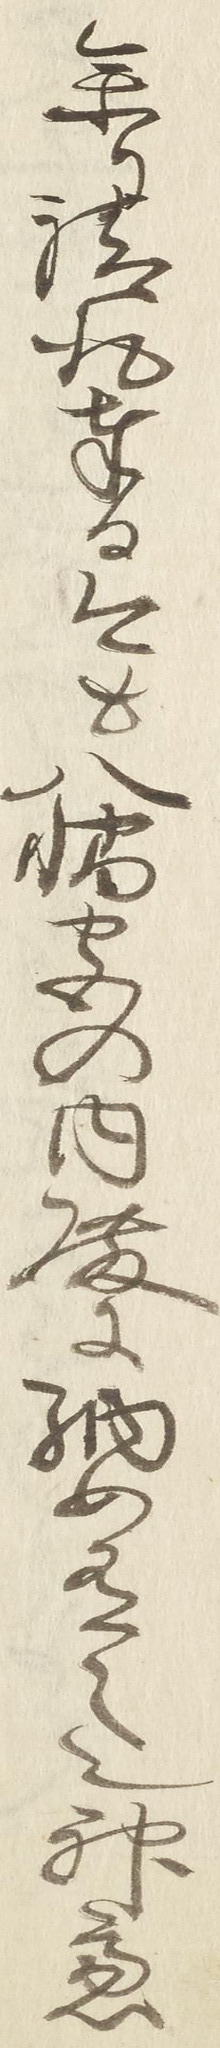参り請取奉る今も八幡宮の内殿に納め有之也神慮
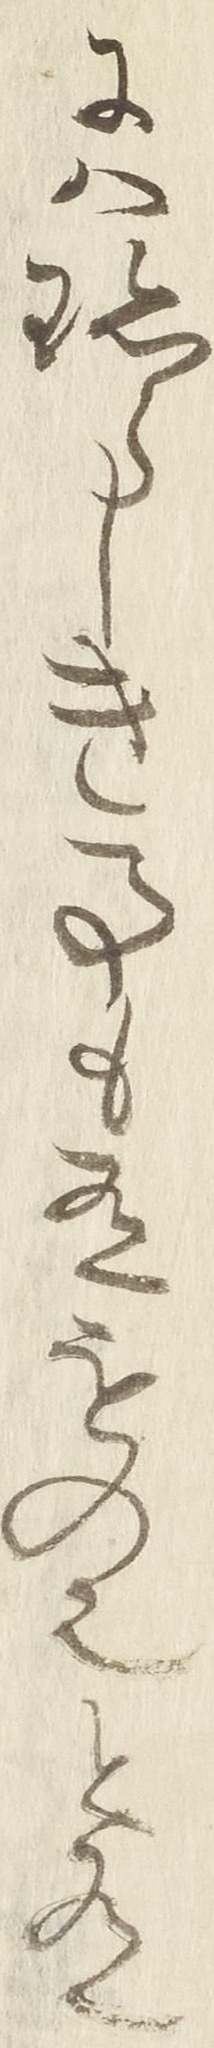には珍らしき事も有もの也と有
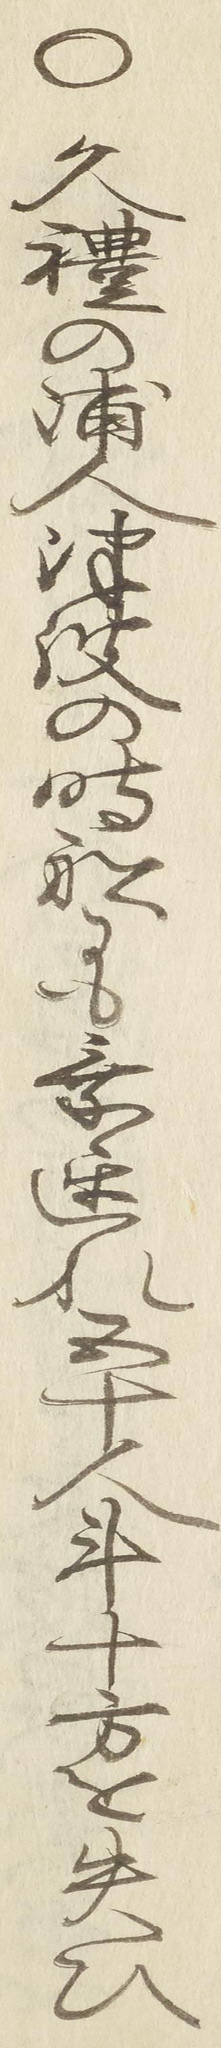〇久禮の浦人津波の時船にも乗遅れ五十人斗十方を失ひ

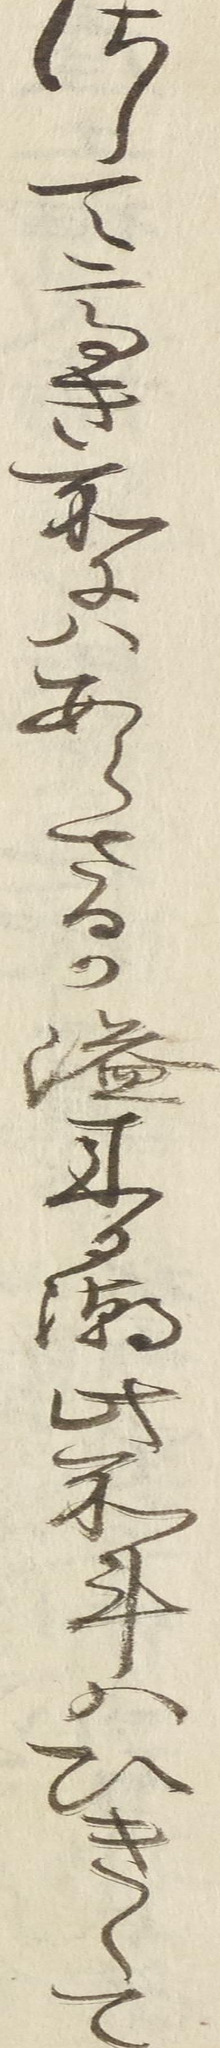さして高き所にはあらさるか溢かりしとそる潮此所斗はひきくて
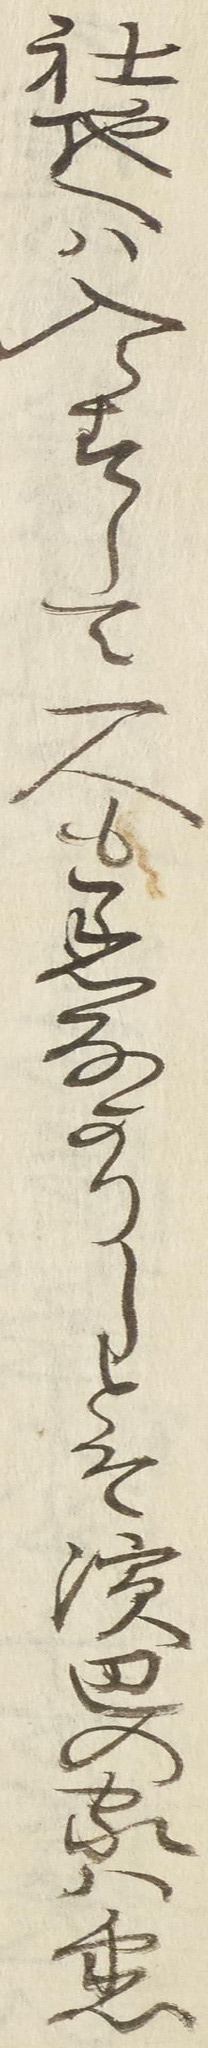社地へは入らすして一人も恙なく浜田の家は悉
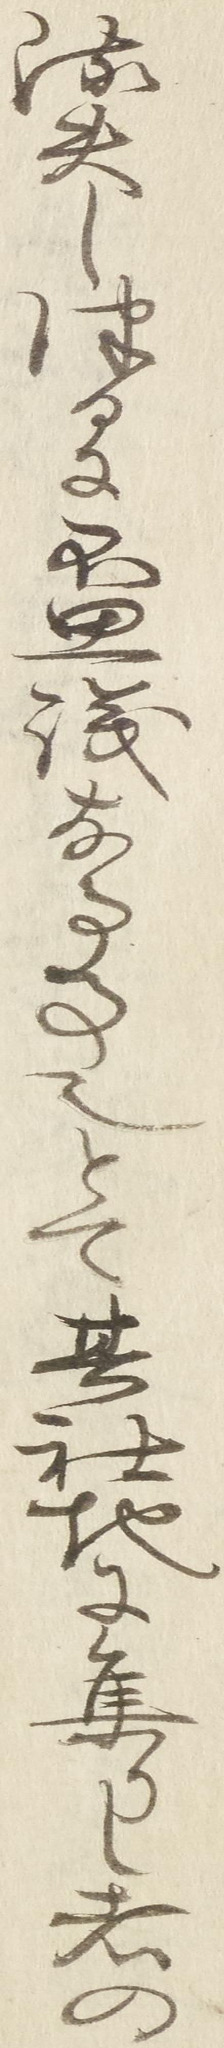流失しつるに不思議なる事也とて其社地に集りし者の
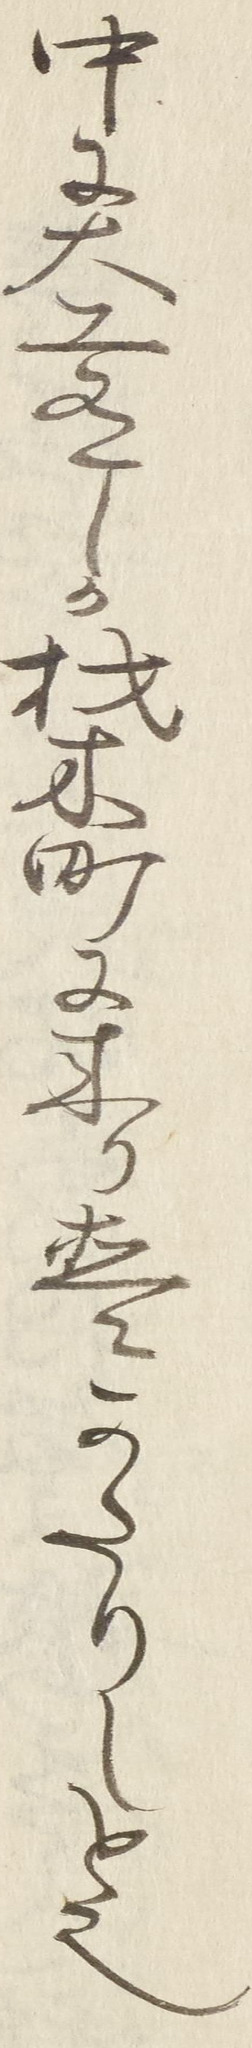中に大工有しか材木町に来り直にかたりしと也
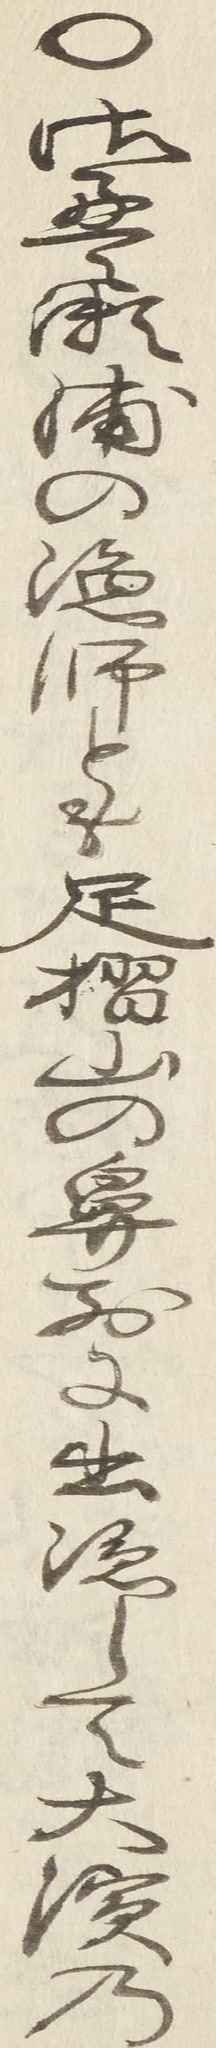〇御畳瀬浦の漁師とも足摺山の鼻前に出漁して大浜の
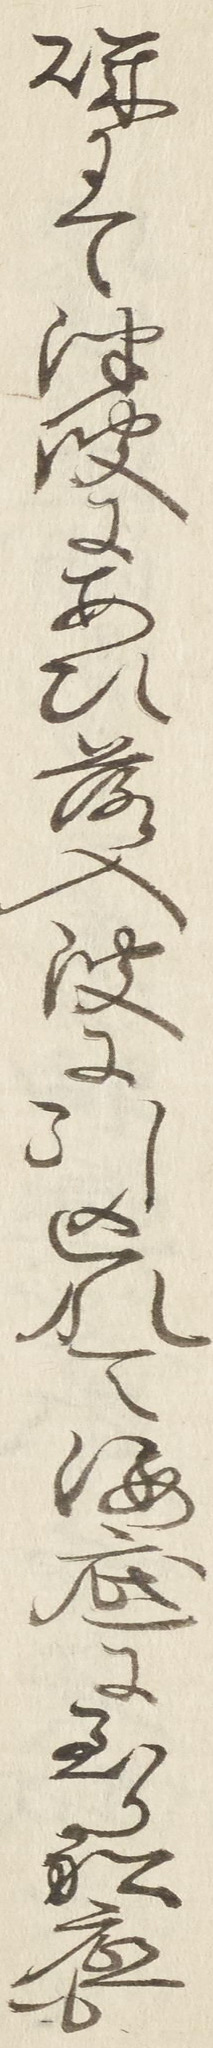磯にて津波にあひ落入波に引込れて海底に至り船底も
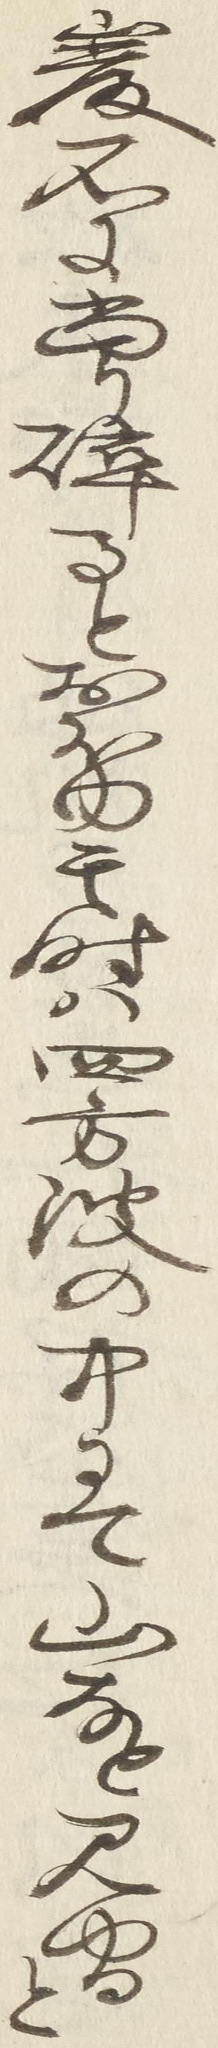巖石に当り砕るとおほゆ其時は四方波の中にて山なと見ゆると
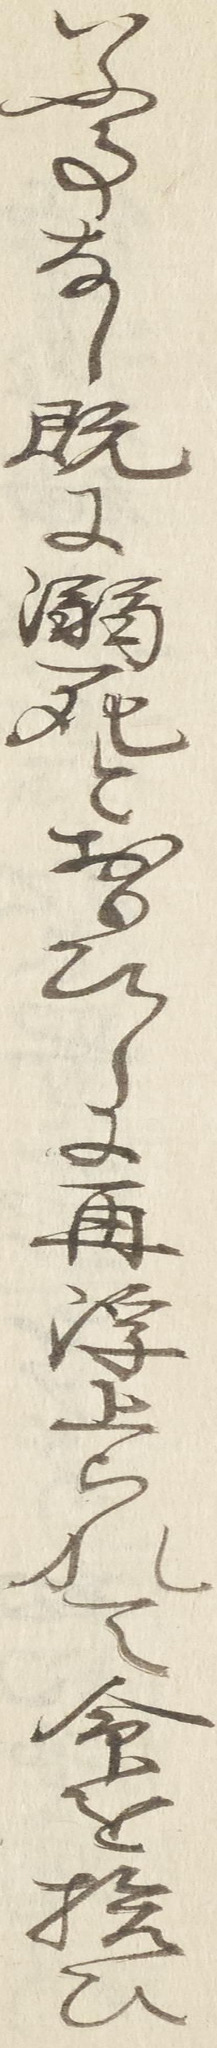いふ事なし既に溺死とおもひしに再浮上られて命を拾ひ
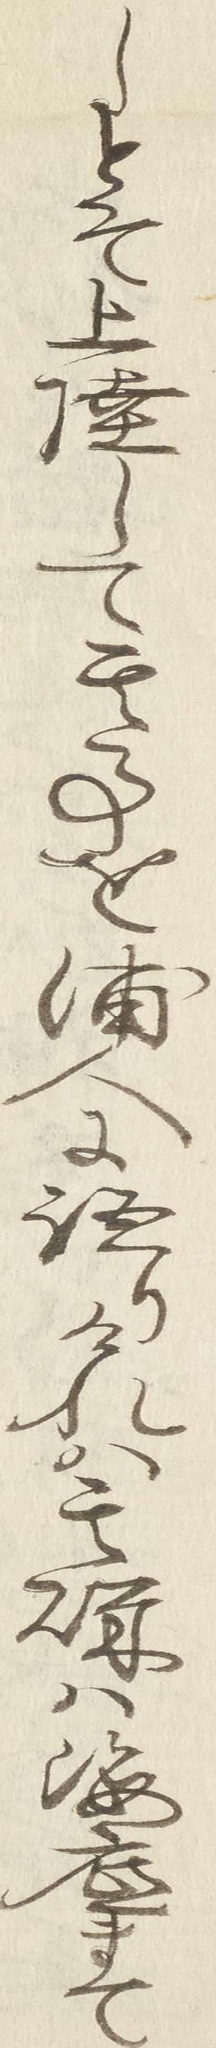しとそ上陸して其事を浦人に語りけれは其磯は海底まて
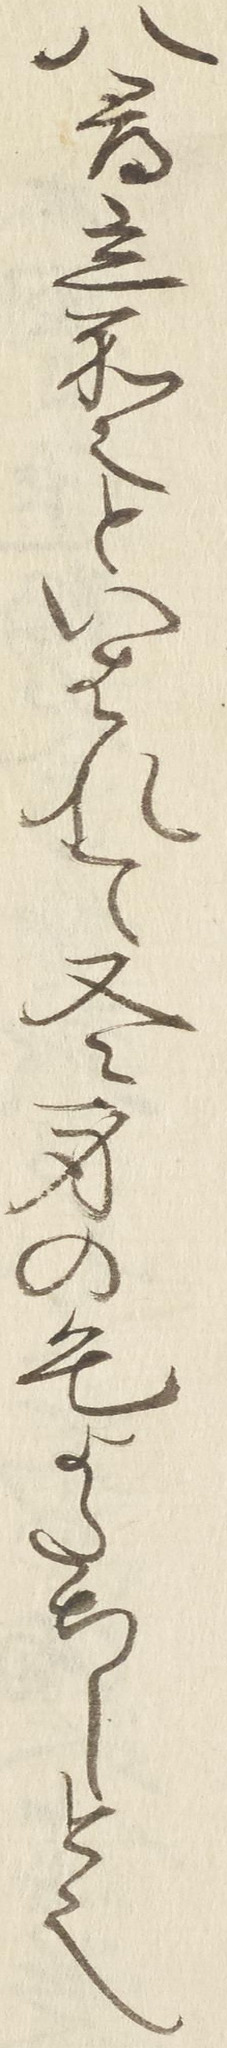八尋立所也といわれて又々身の毛よたちしと也
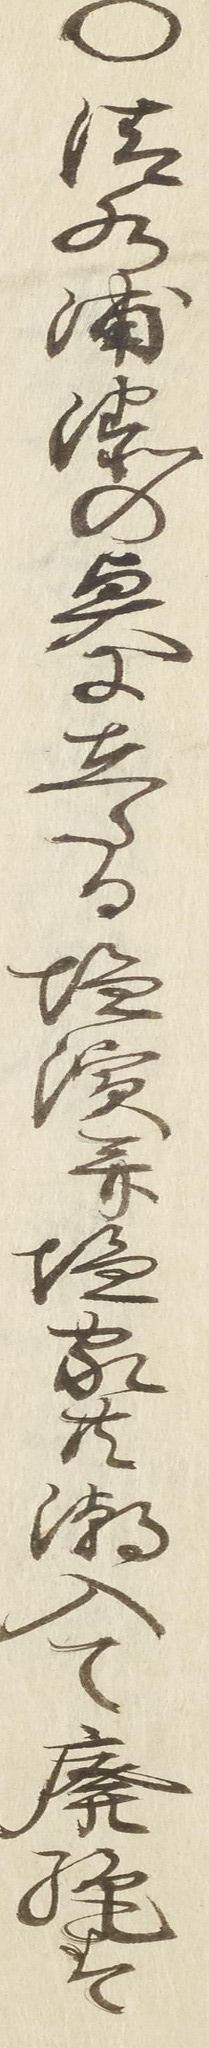〇清水浦添の奥に在たる塩浜并塩家共潮入て廃絶す
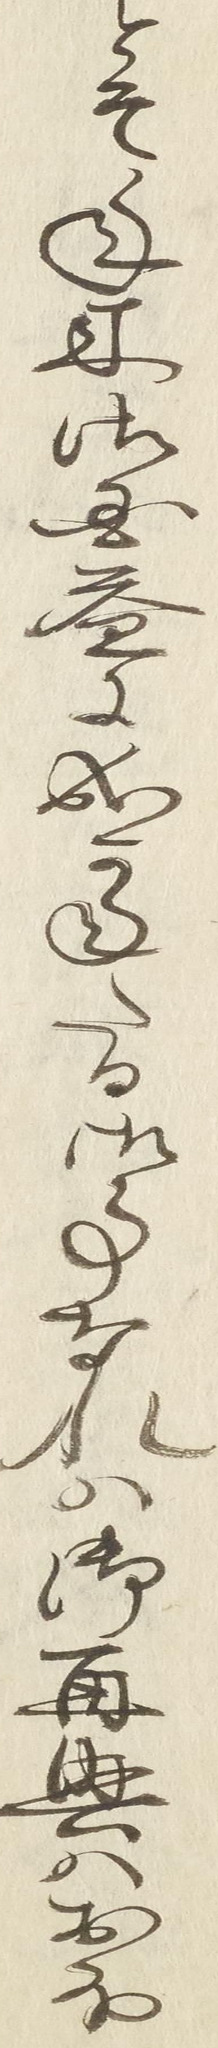とそ年来御国益に成かねたる御事なれは御再興はおほ
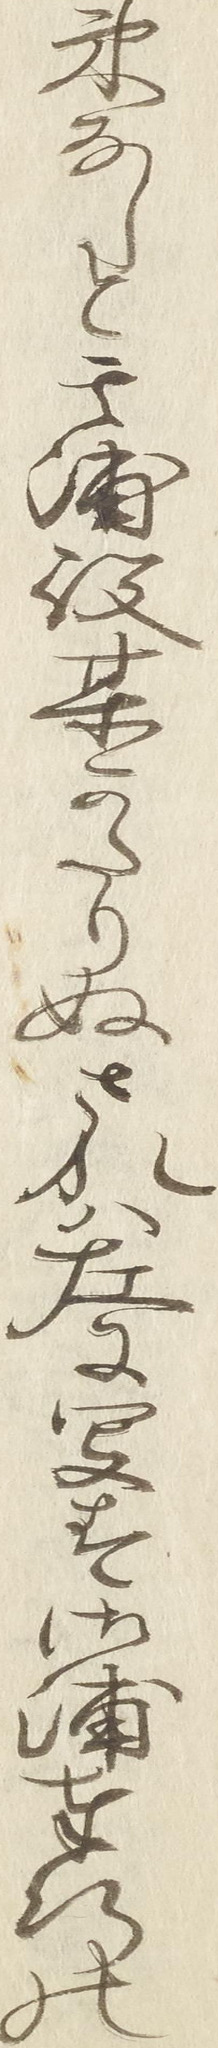束なしと其浦役某かたりぬされは左に写す御浦奉行の
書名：地震記　上
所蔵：東京大学地震研究所図書室 Earthquake Research Institute Library, The University of Tokyo, JAPAN
